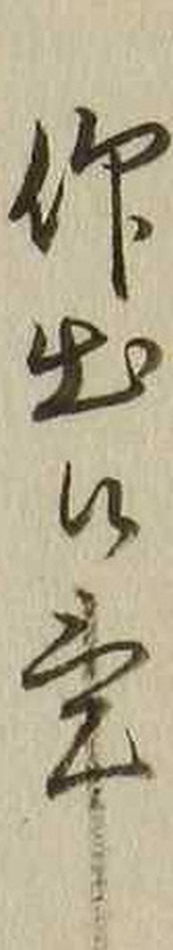仰出候事
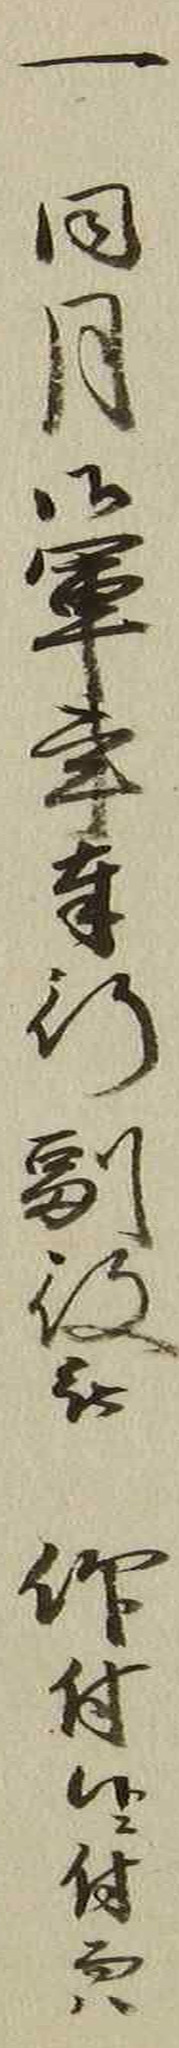一同月御軍事奉行副役被仰付候に付而は
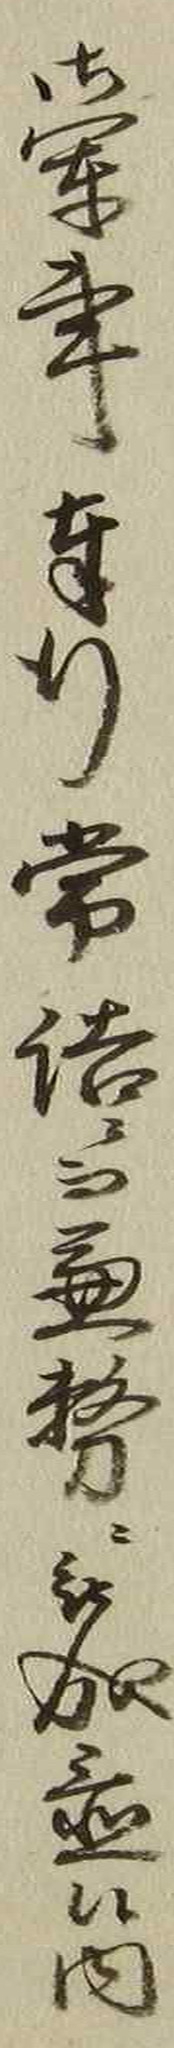御軍事奉行常詰に而兼務に被成置候内
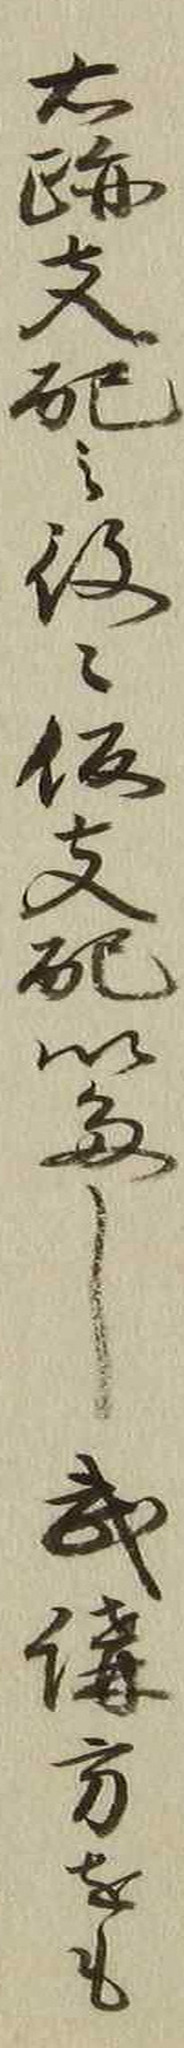右跡支配之役に仮支配いたし武講方をも
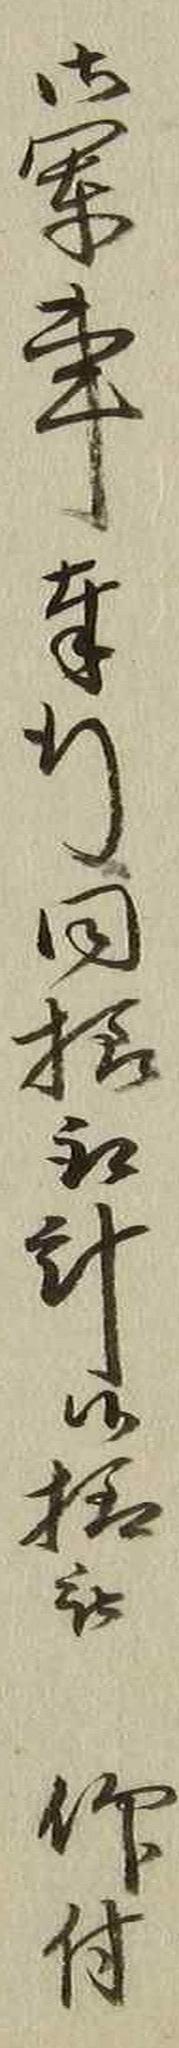御軍事奉行同様取計候様被仰付
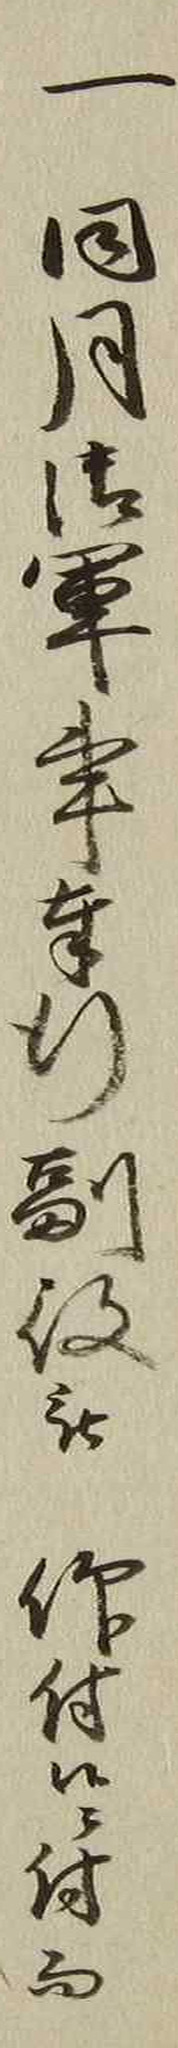一同月御軍事奉行副役被仰付候に付而は
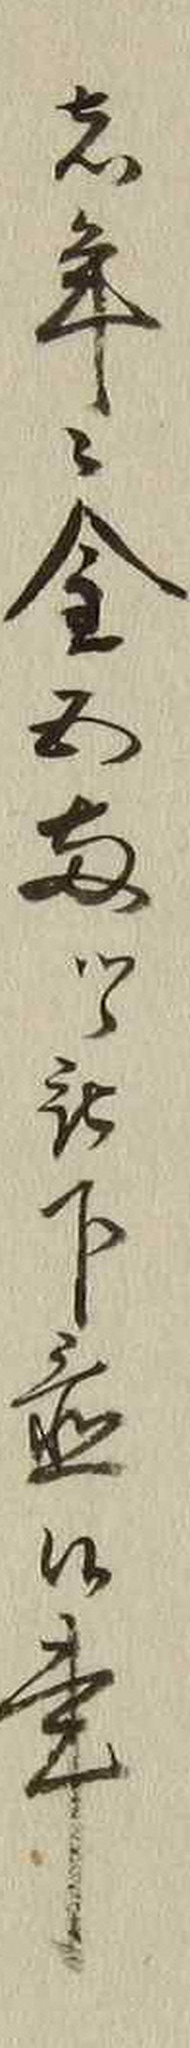は年々金五両つヽ被下置候事
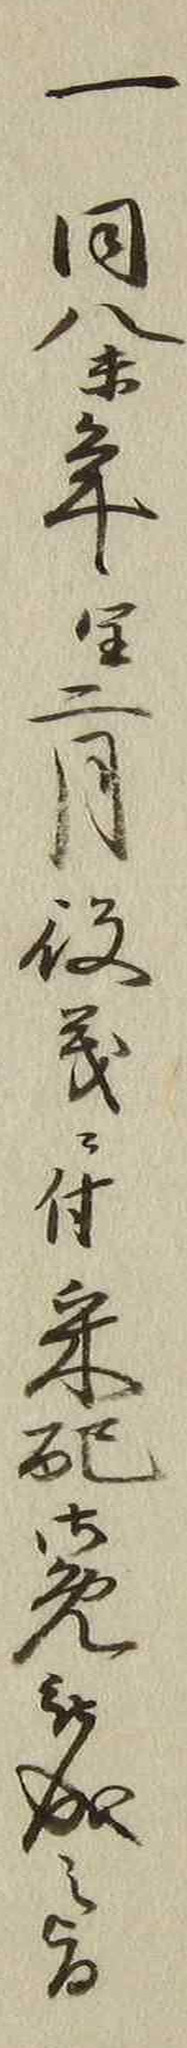一同八未年閏二月役義に付采配御免被成之旨
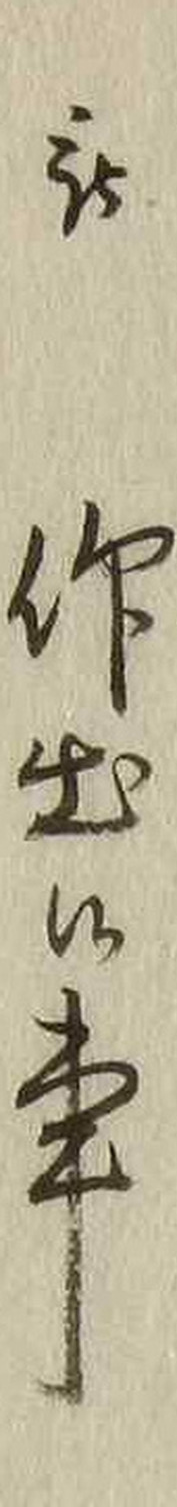被仰出候事
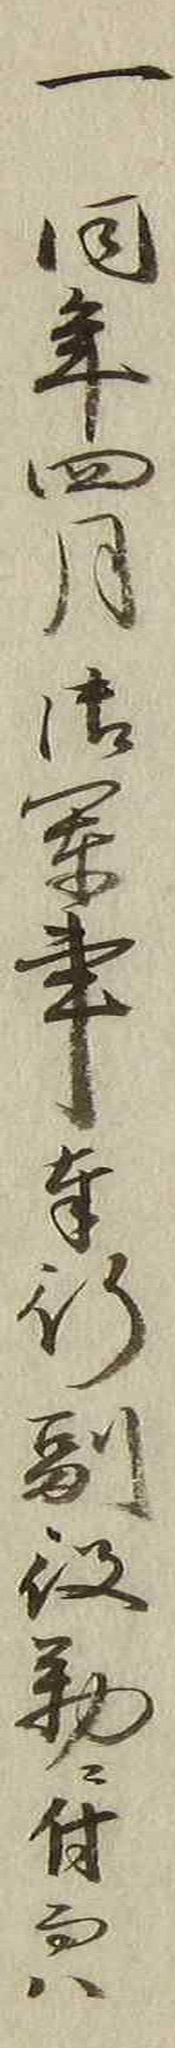一同年四月御軍事奉行副役勤に付而は
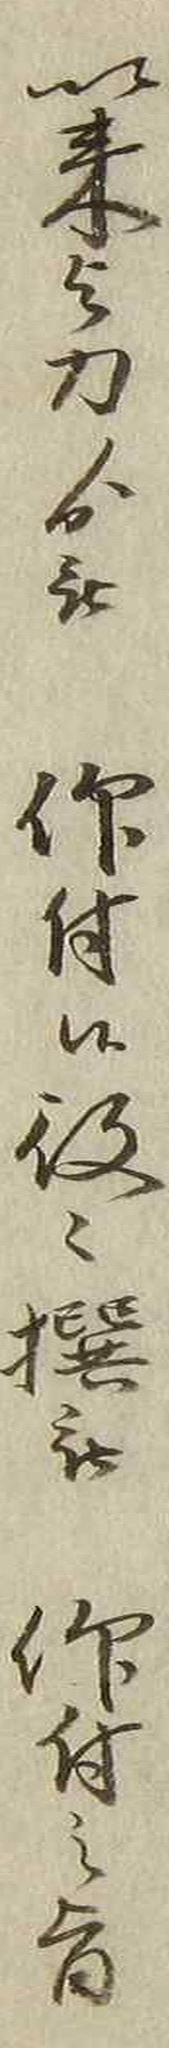以来与力ゟ被仰付候役々撰被仰付之旨
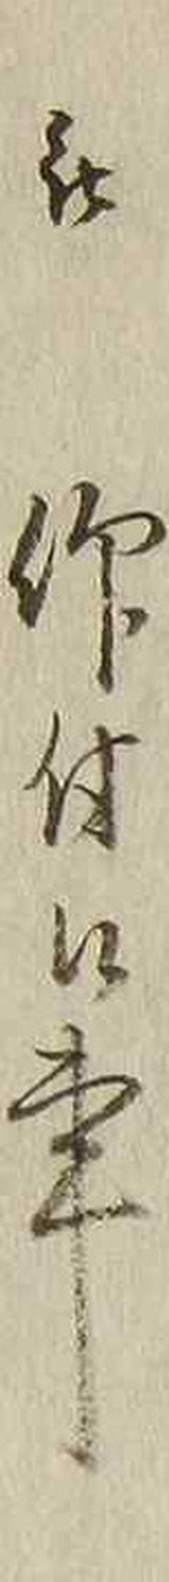被仰付候事
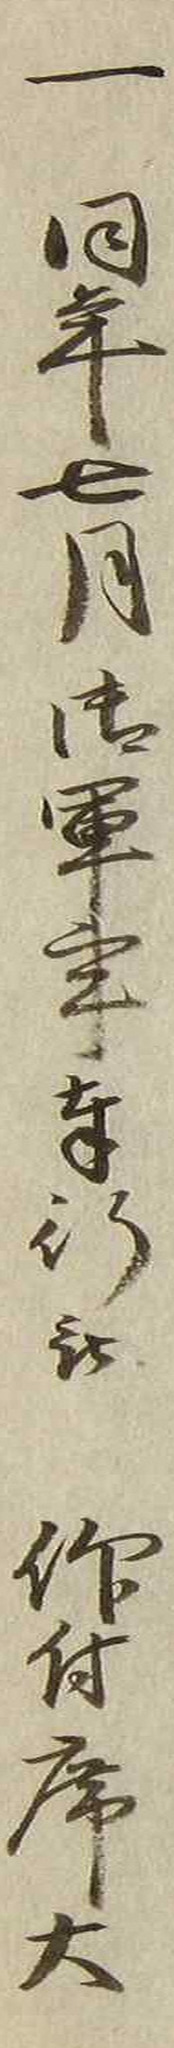一同年七月御軍事奉行被仰付席大
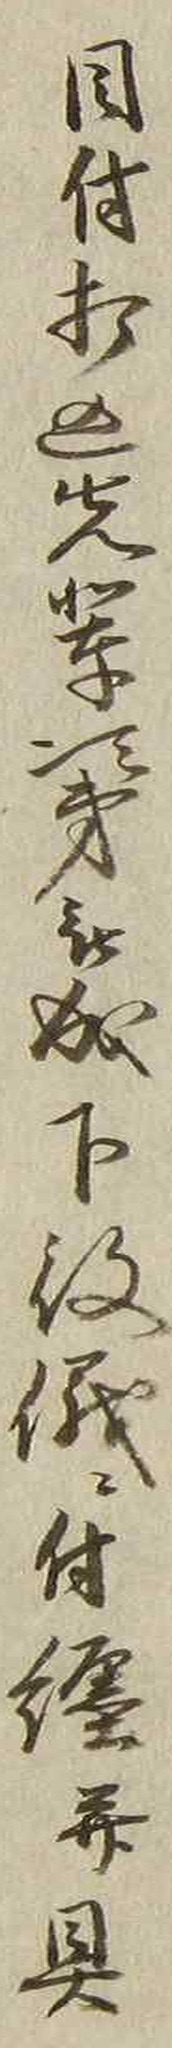目付打込先輩次第被成下役儀に付纏并具
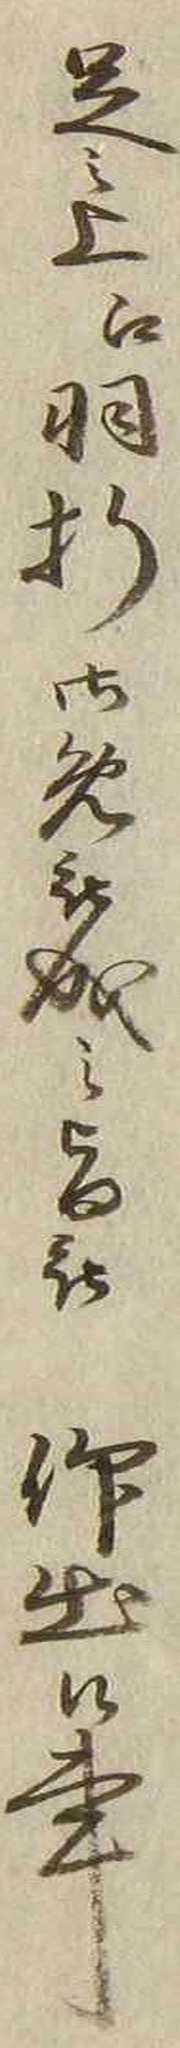足之上江羽折御免被成之旨被仰出候事

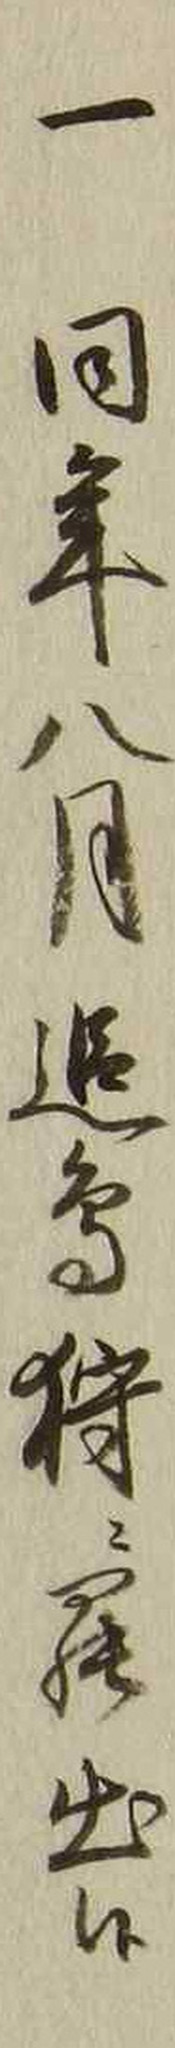一同年八月追鳥狩に罷出候
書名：諸士系譜　巻之133　た之部9
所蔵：会津若松市立会津図書館
